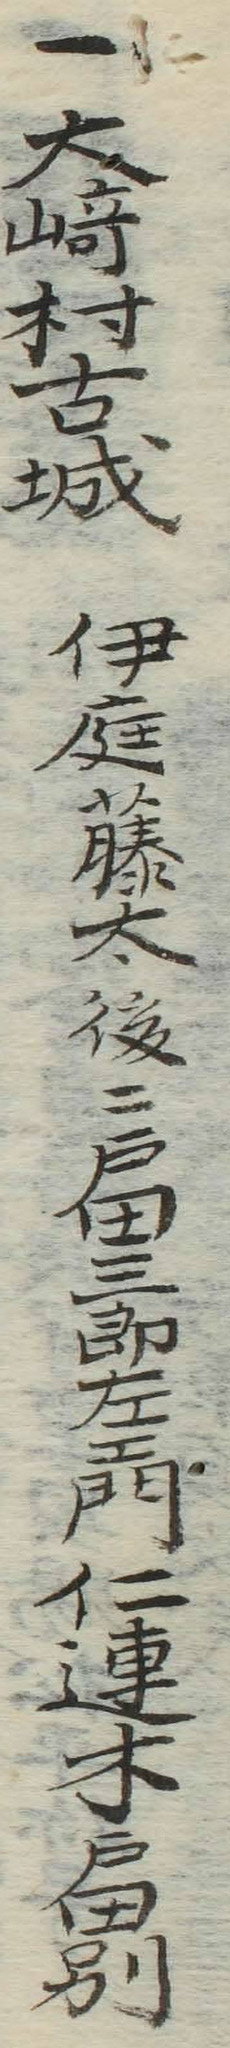一大崎村古城伊庭藤太後ニ戸田三郎左エ門仁連木戸田別
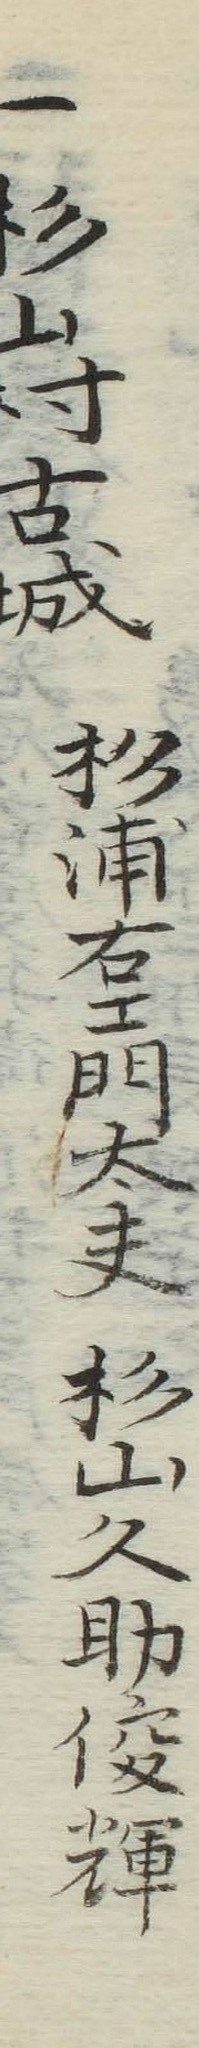一杉山村古城杉浦右エ門太夫杉山久助俊輝
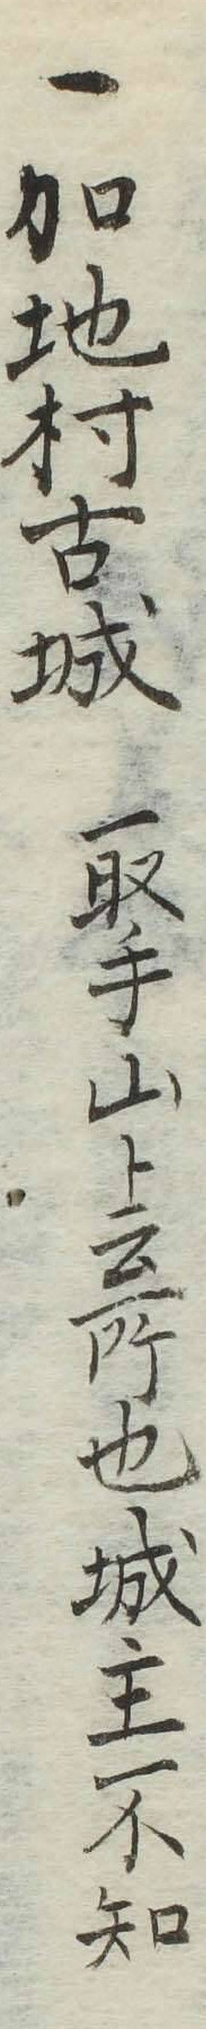一加地村古城取手山ト云所也城主不知
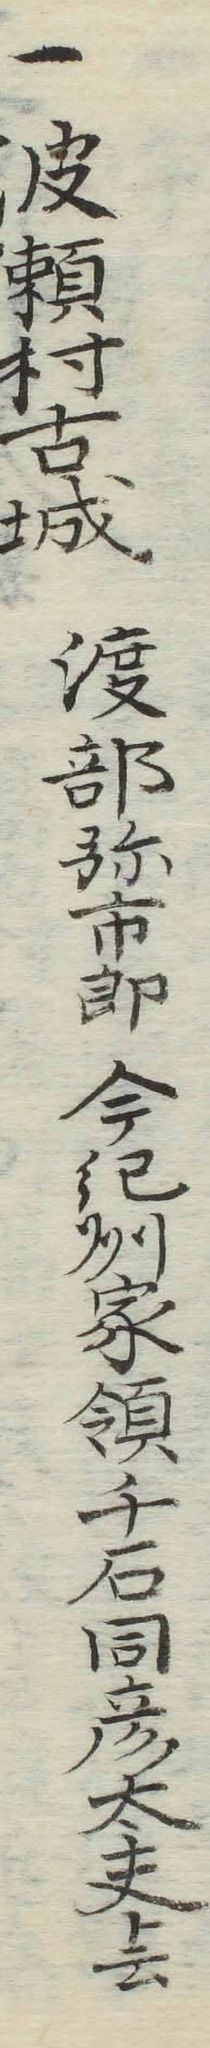一波瀬村古城渡部弥市郎今紀州家領千石同彦太夫ト云
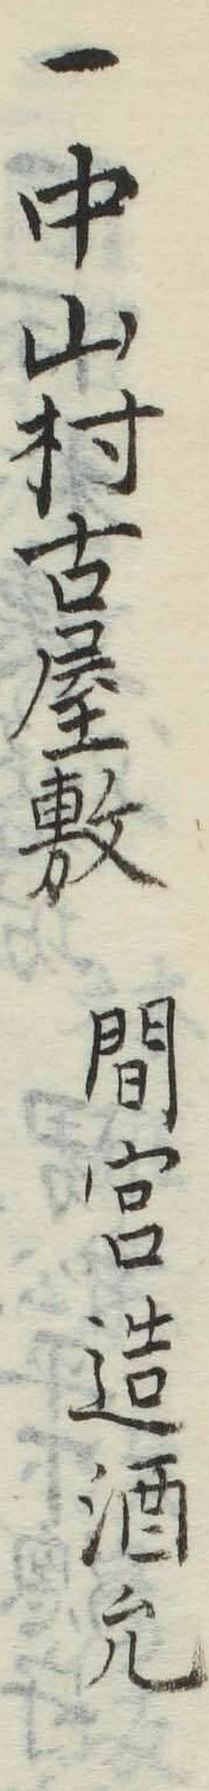一中山村古屋敷間宮造酒允
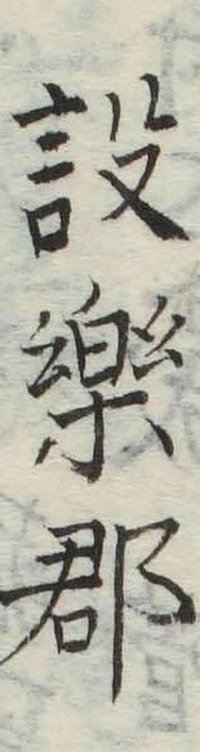設楽郡

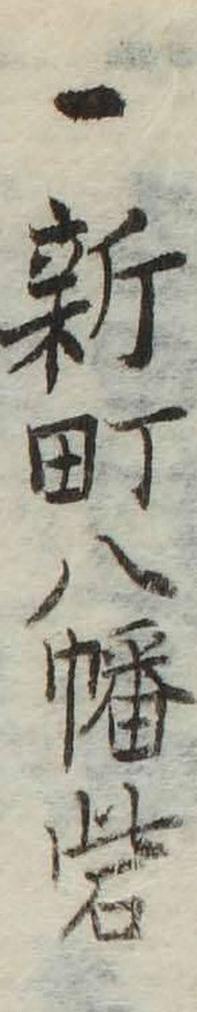一新町八幡砦
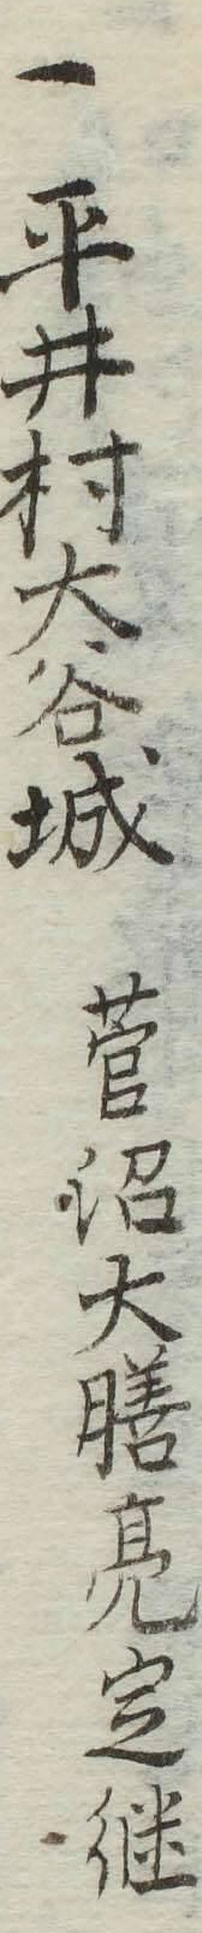一平井村大谷城菅沼大膳亮定継
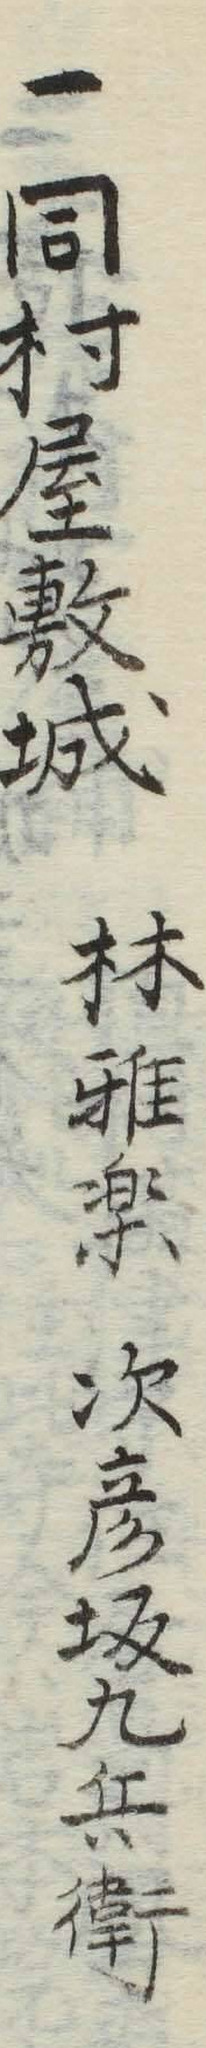一同村屋敷城林雅楽次彦坂九兵衛
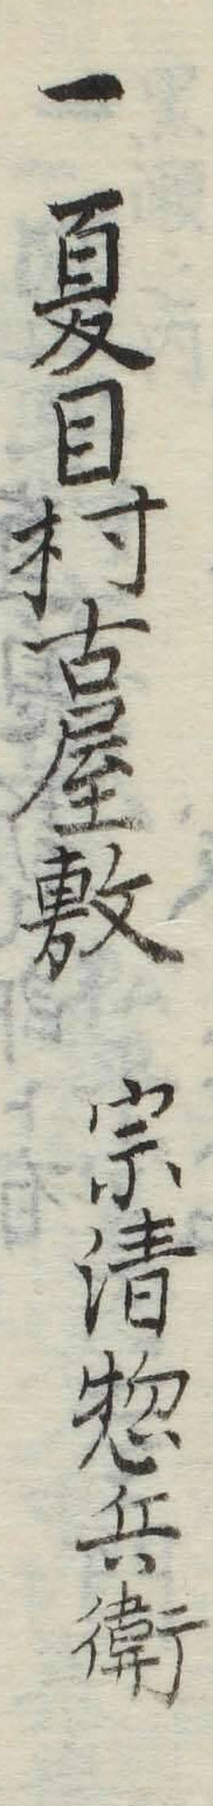一夏目村古屋敷宗清惣兵衛
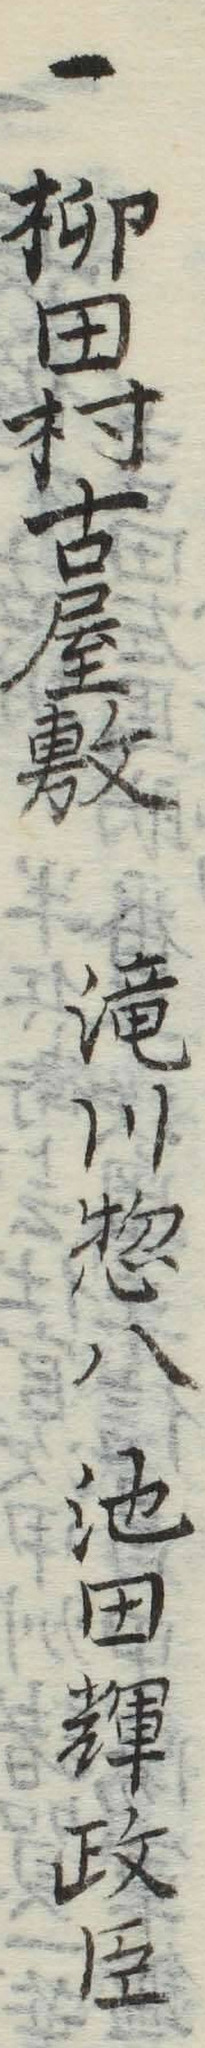一柳田村古屋敷滝川惣八池田輝政臣
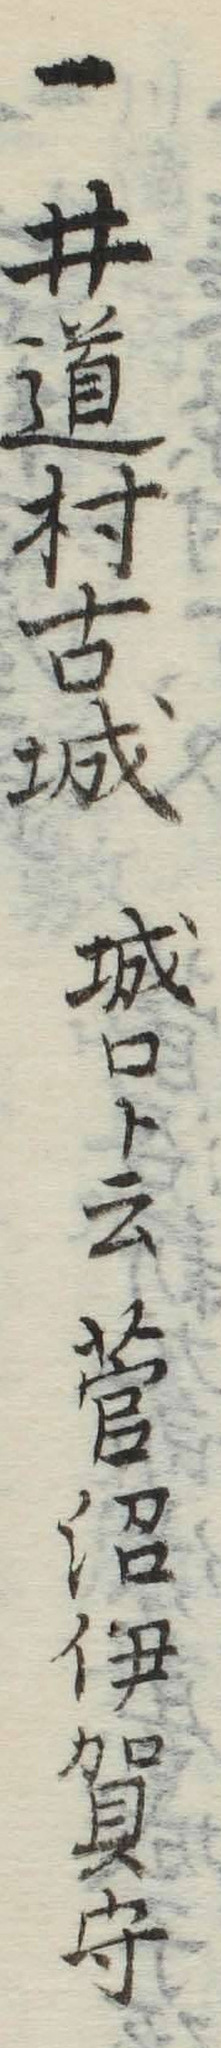一井道村古城城口ト云菅沼伊賀守
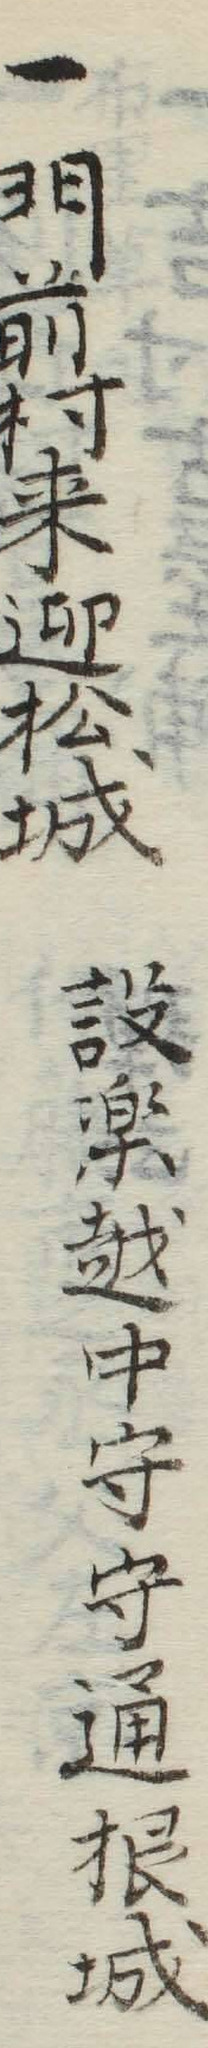一門前村来迎松城設楽越中守守通根城
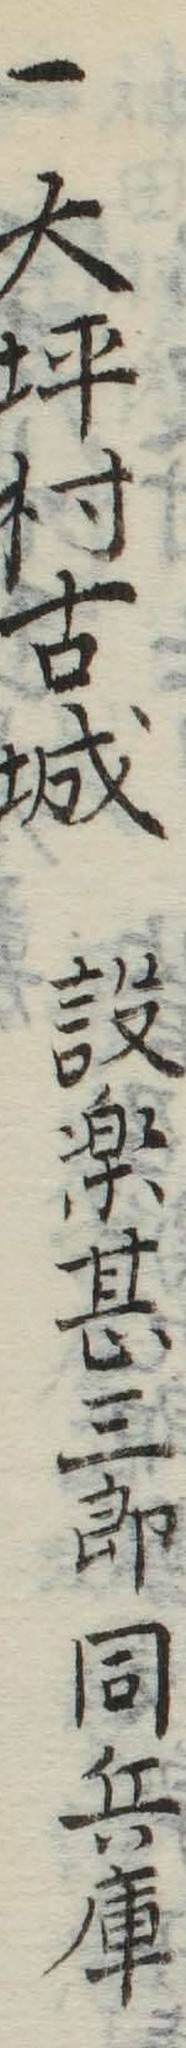一大坪村古城設楽甚三郎同兵庫
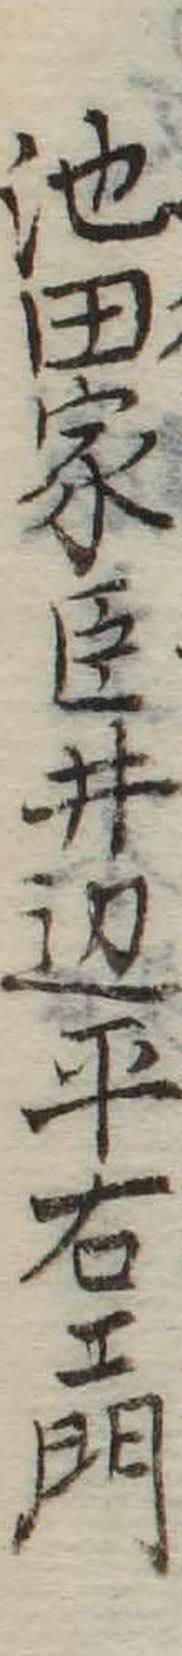池田家臣井辺平右エ門

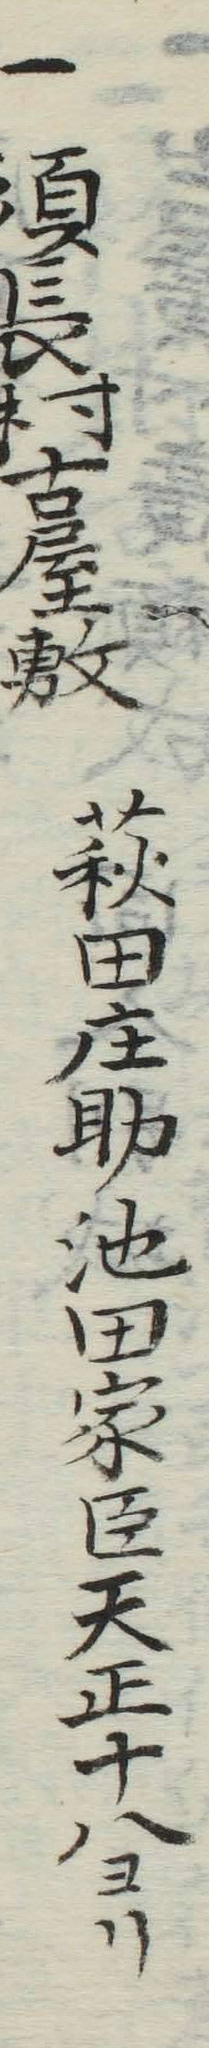一須長村古屋敷萩田庄助池田家臣天正十八ヨリ
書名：三河国二葉松
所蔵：国文学研究資料館
